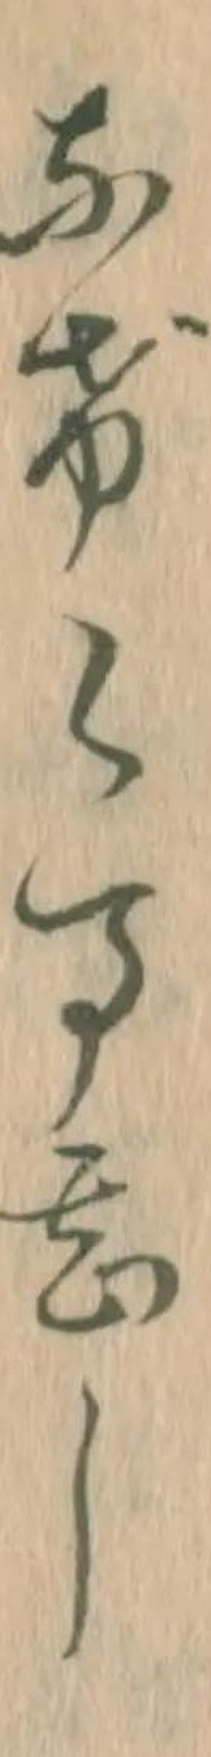な希く事甚し
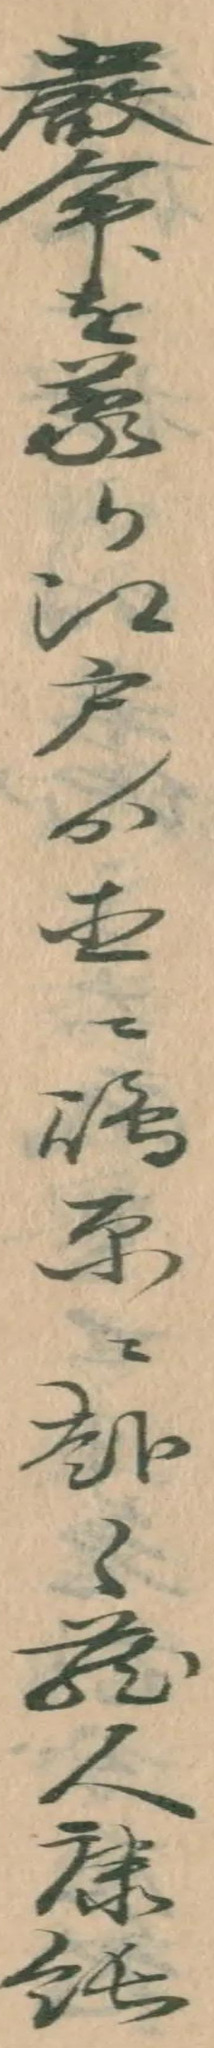厳命を蒙り江戸ゟ直に島原に赴く蔵人康純
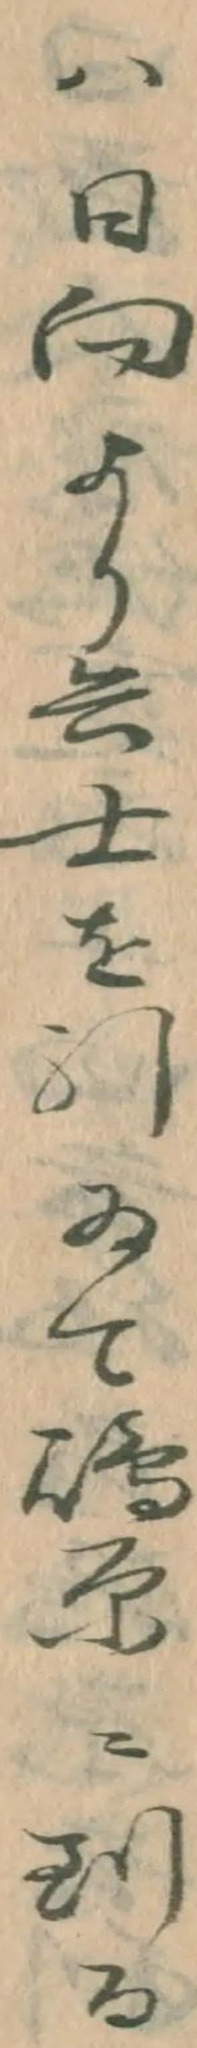は日向より兵士を引ゐて島原に到る

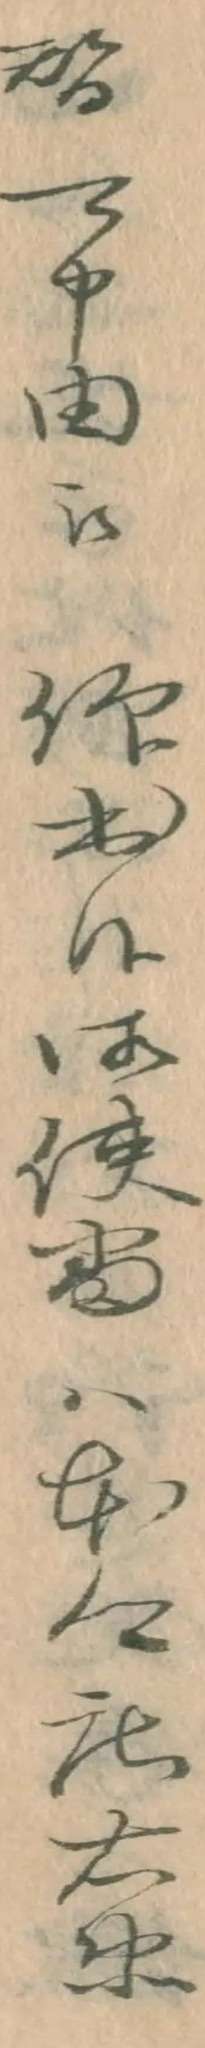替可申由被仰出候御使番は本郷庄右衛
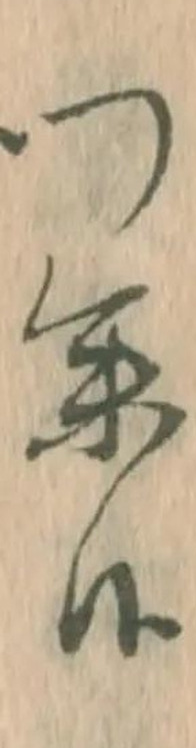門参候
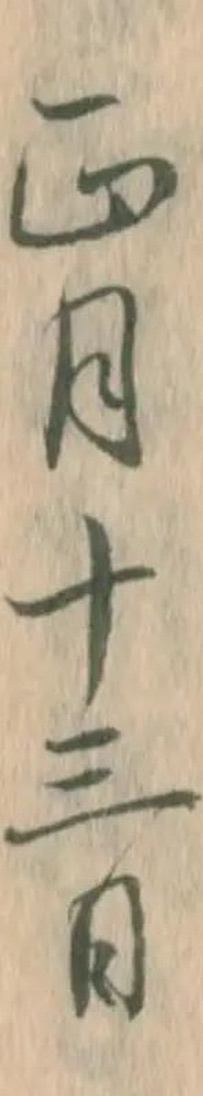正月十三日
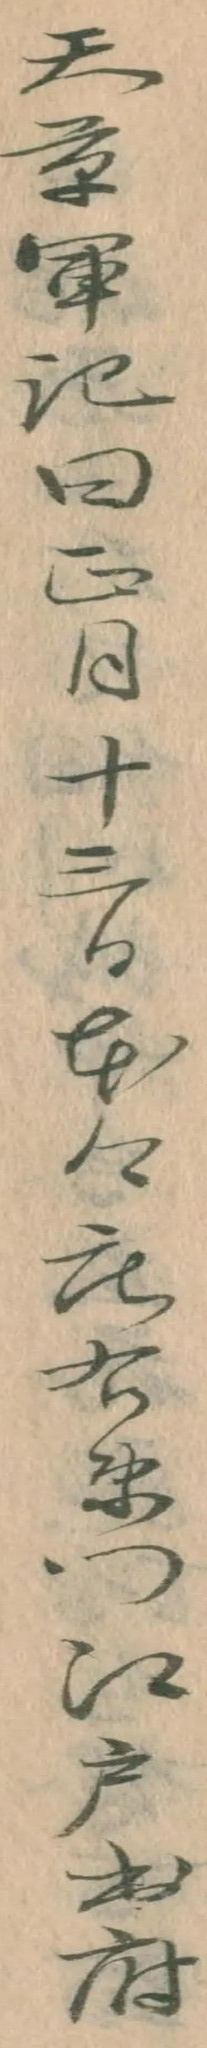天草軍記曰正月十三日本郷庄右衛門江戸出府
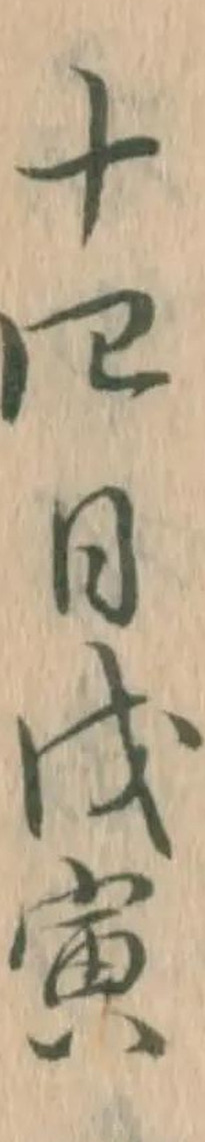十四日戌寅
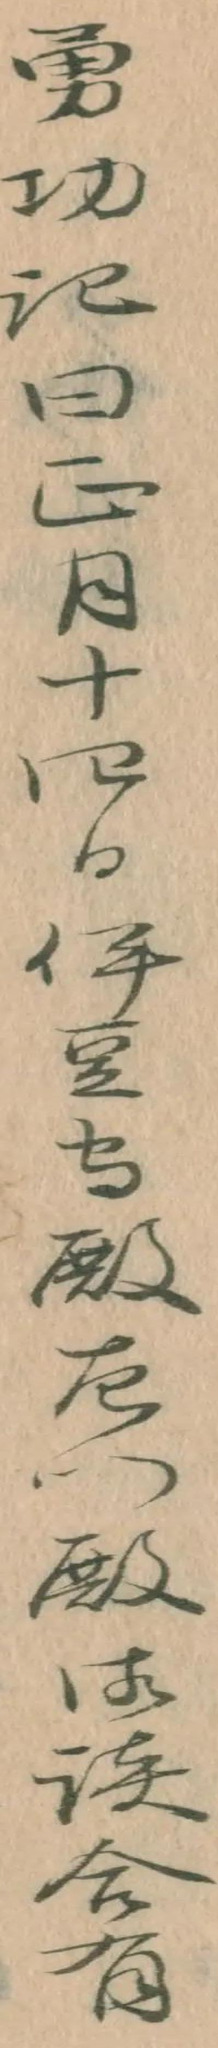勇功記曰正月十四日伊豆守殿左門殿御談合有
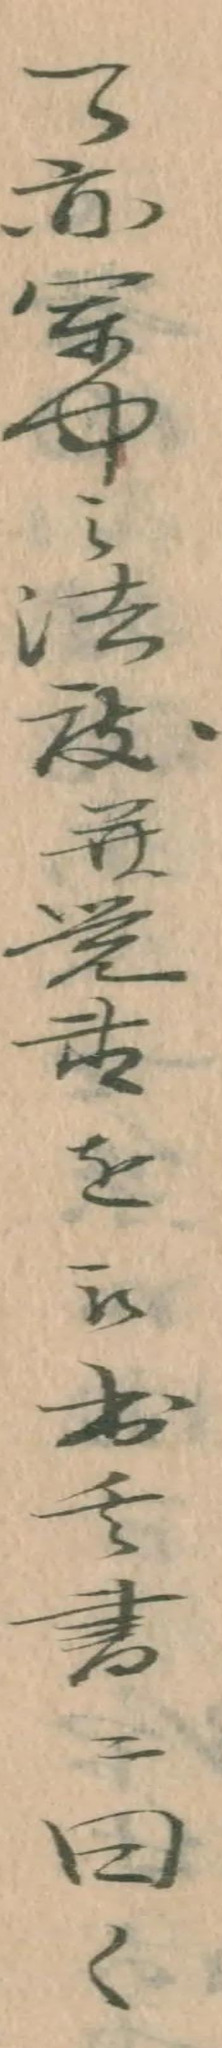て亦軍中之法度幷覚書を被出其書に曰く
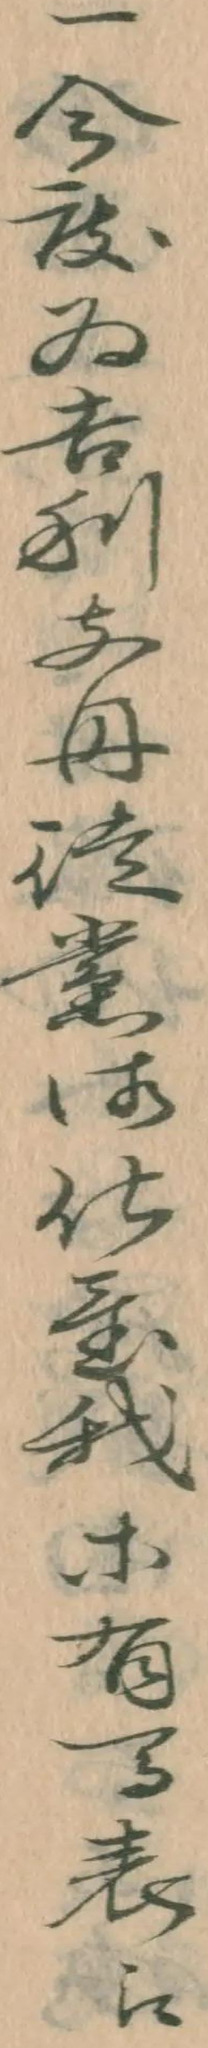一今度ゐ吉利支丹徒党御仕置我等有馬表江
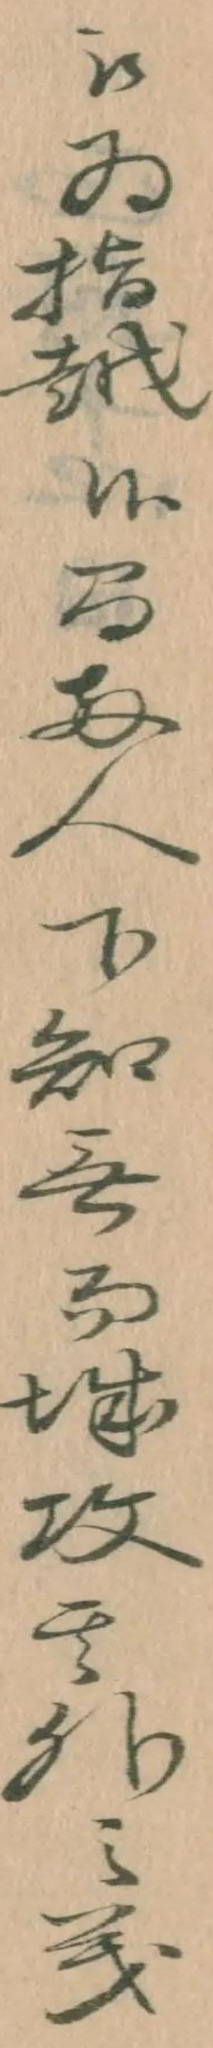被ゐ指越候間両人下知無而城攻其外之義
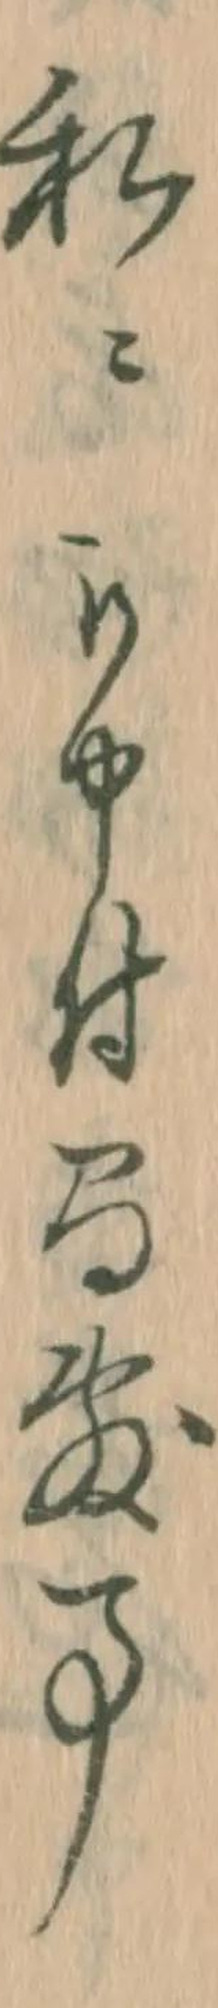私に被申付間敷事
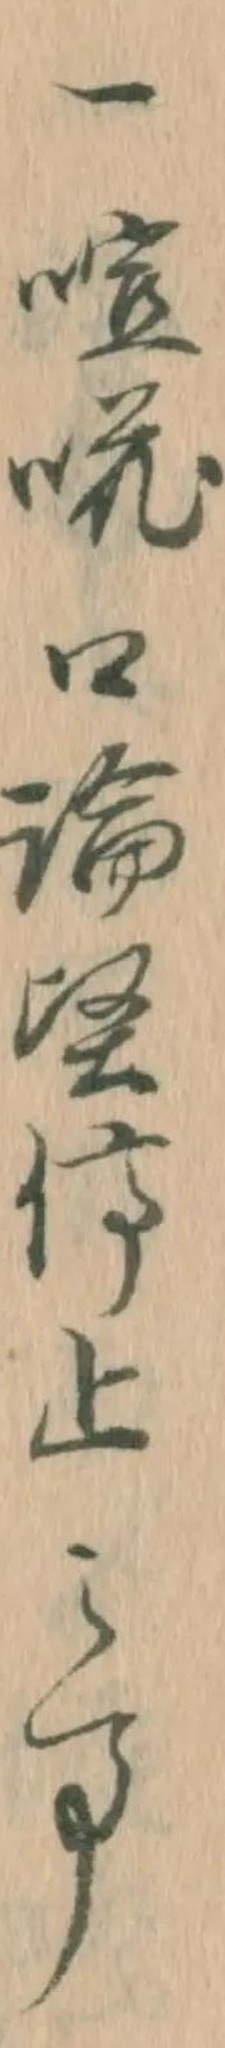一喧嘩口論堅停止之事
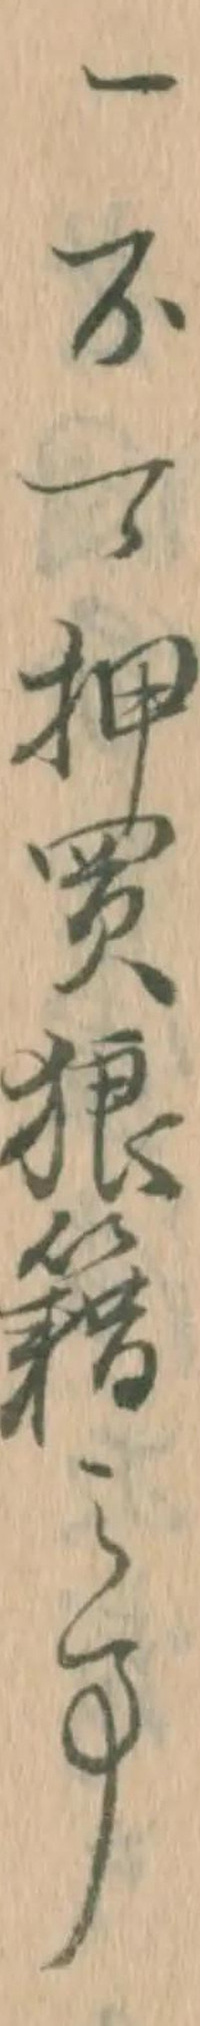一不可押買狼藉之事
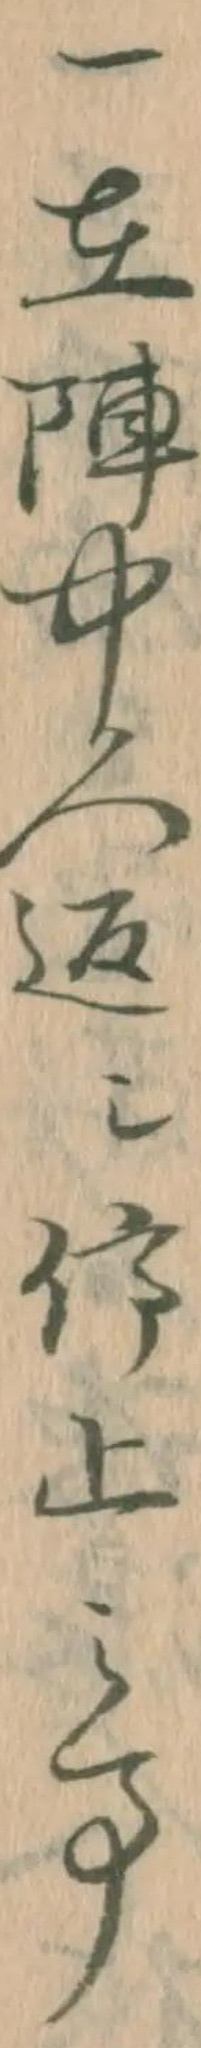一在陣中人返し停止之事
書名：切支丹御退治記 49巻. [6]
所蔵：国立国会図書館 National Diet Library, JAPAN
